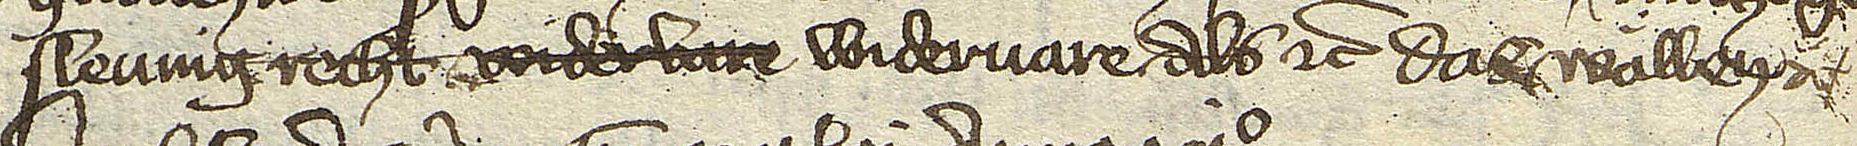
ſlewnig recht widervare wideruare / Als ec* das wöllen ec*
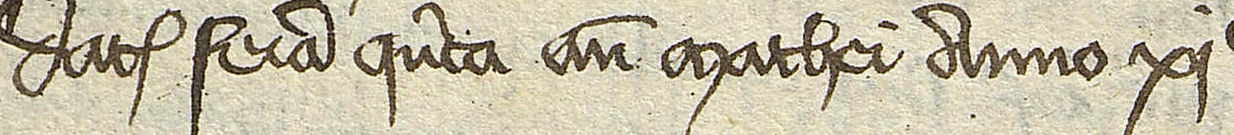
dat* feia* qnta* an* Mathei Anno xi*
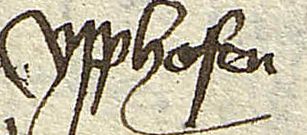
Ypphofen
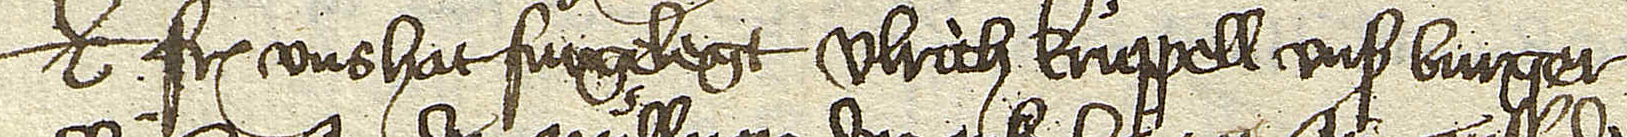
L* fr* vns hat fürgelegt Vlrich Krüppell vnſ* burger
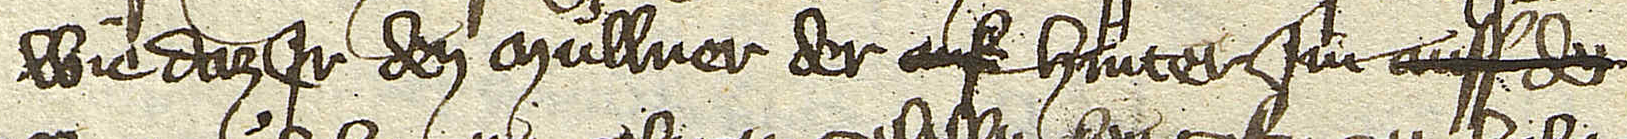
wie daʒ Ir den Müllner der auf hinter Im auff der
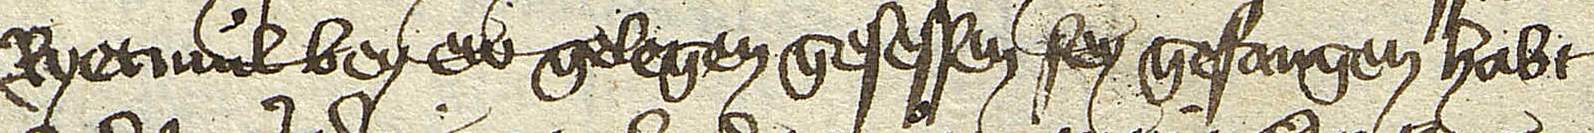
Ryetmül bey ew gelegen geſeſſen ſey gefangen habt
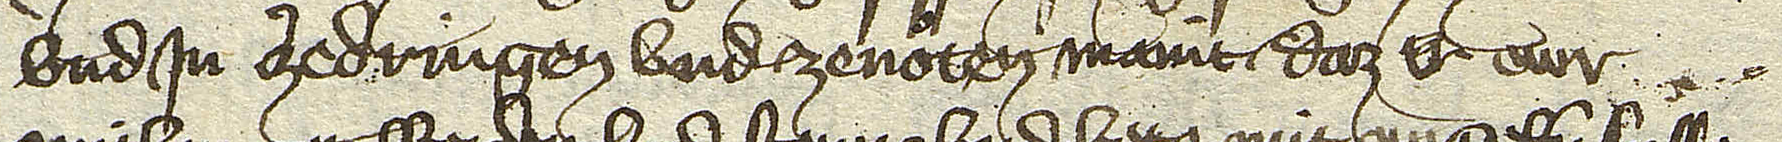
vnd In cʒedringen vnd cʒenöten maint / daʒ Er ewr
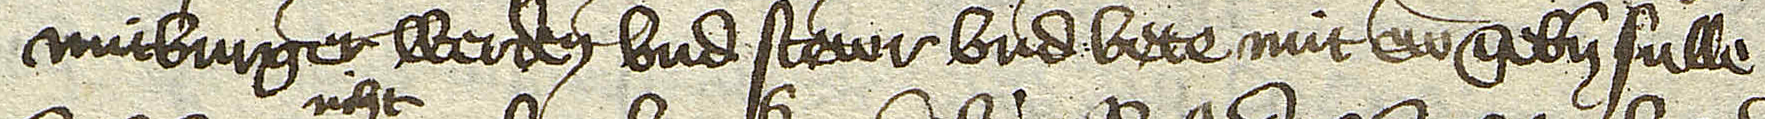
mitburger werden vnd ſtewr vnd bete mit ew gebn* ſulle
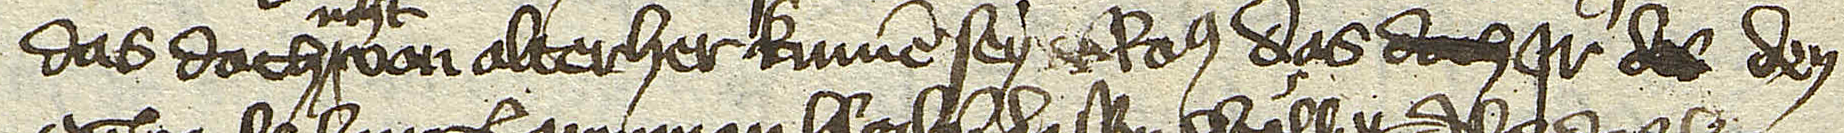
das doch von alterher kume* ſey / Ro* das doch Ir des den
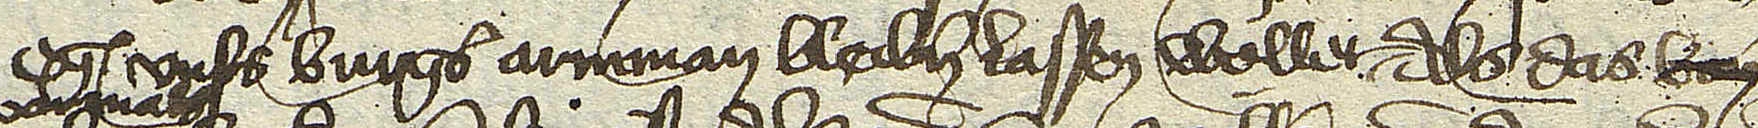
eg* vnſ*s burgs* armman bleibn* laſſen wöllet / Als das von
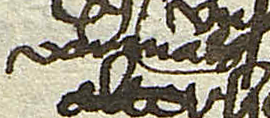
vormals
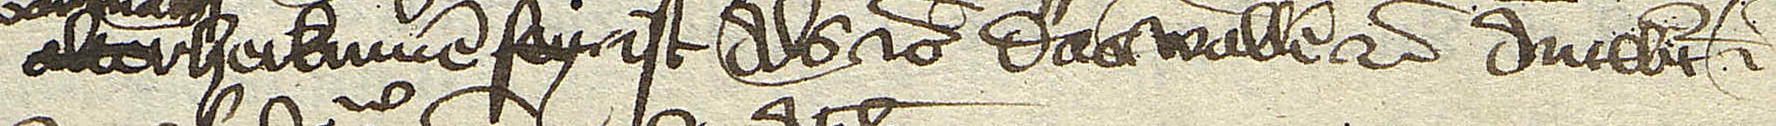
alterherkume* ſey iſt Als ec* das wölle* ec* Antwt* ec*
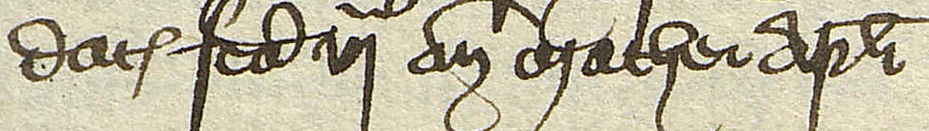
dat* fea* vi* an* Mathei Apli*
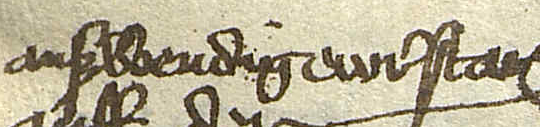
auſʒwendig ewr* ſtat
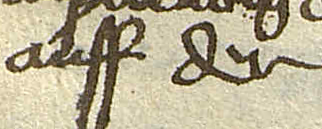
auff der
